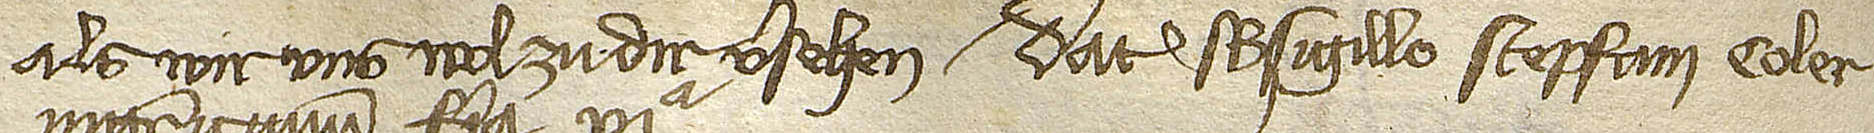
als wir vns wol ʒu dir v*ſehen / Dat* ſ*ſigillo ſtepfan Coler
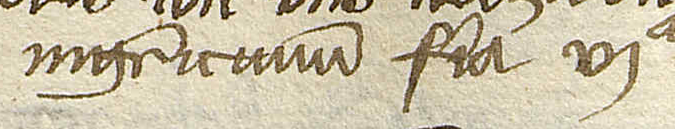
mgri*ciuiu* fi*a vi*
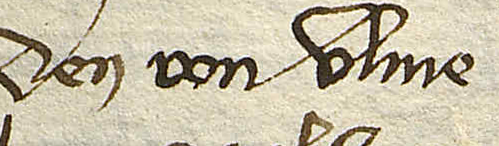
Den von Vlme
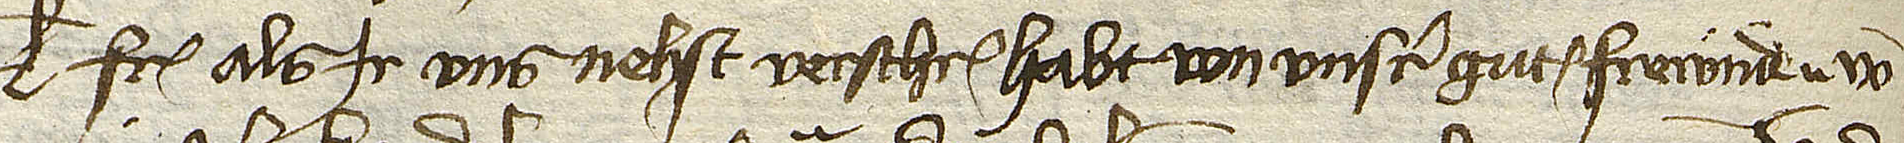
L* fr* als Ir vns nehſt verſchr* habt von vnſr* gut* freẅnde ~ vo*
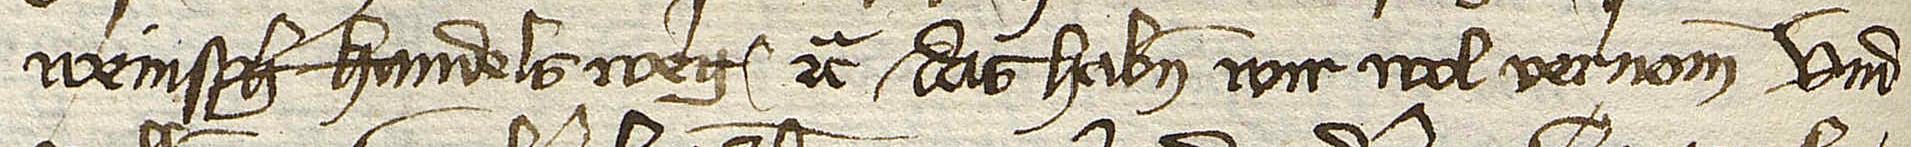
weinſp*g handels weg* ec* / das habn* wir wol vernom* Vnd
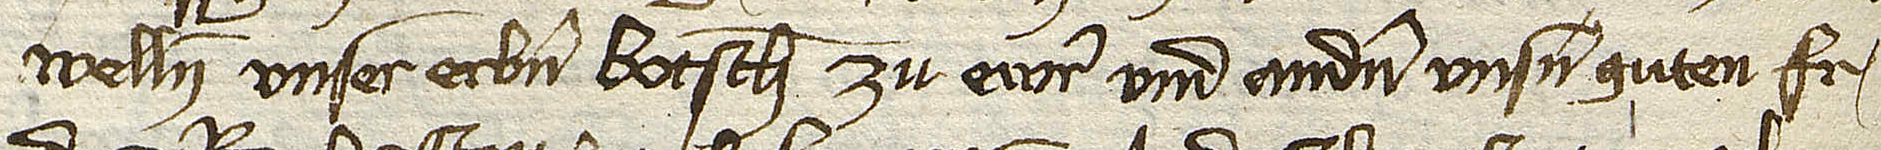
welln* vnſer erbn* botſch* ʒu ewr* vnd andn* vnſn* guten fr*
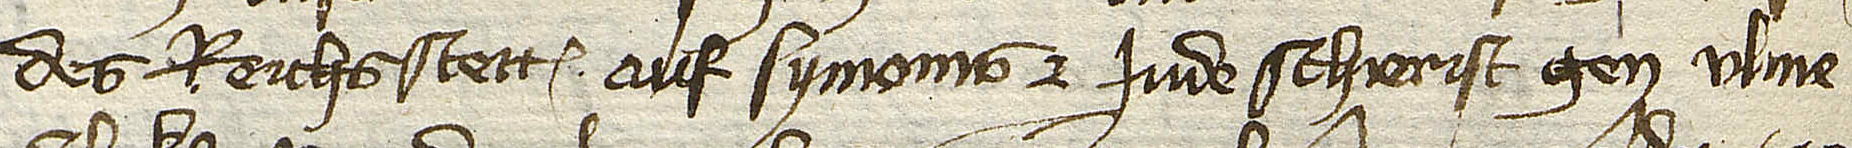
des Reichsſtett* . auf ſymonis @ Iude ſchieriſt gen vlme
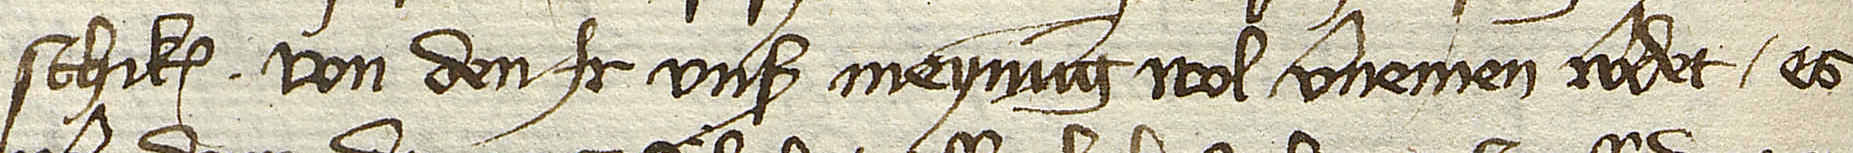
ſchik* . von den Ir vnſ* meynu*g wol v*nemen w*det / es
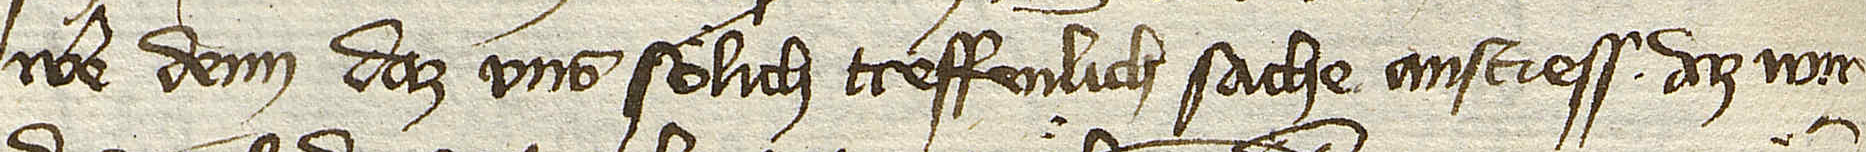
w*e denn daʒ vns ſölich treffenlich ſache anſtieſſ . daʒ wir
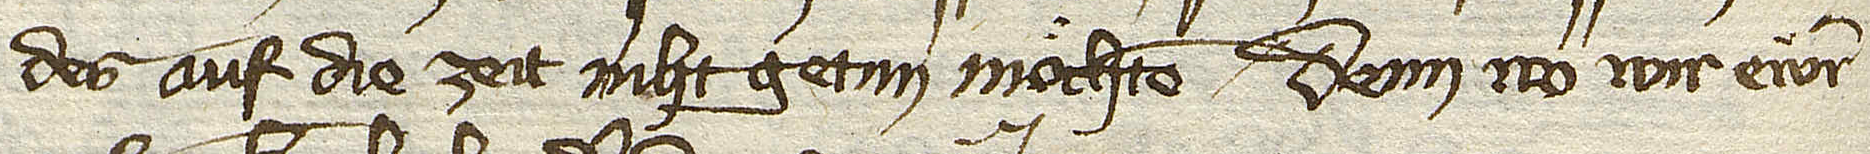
des auf die ʒeit niht getun möchte* / Denn wo wir eẅr*
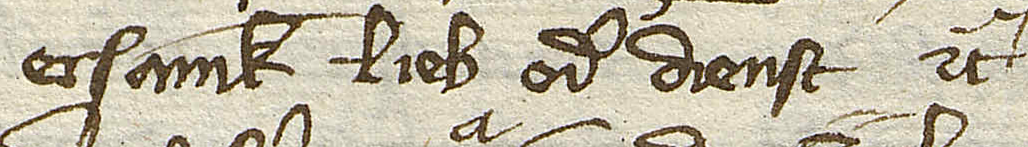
erſamk* lieb od* dienſt ec*
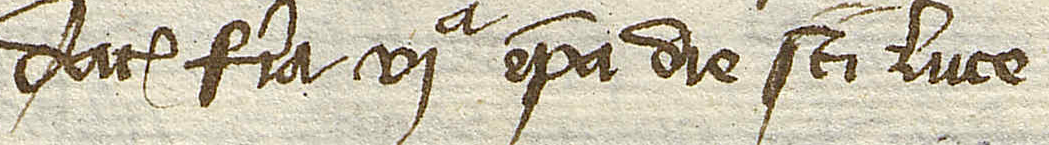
Dat* fi*a vi* ipa* die ſci* Luce
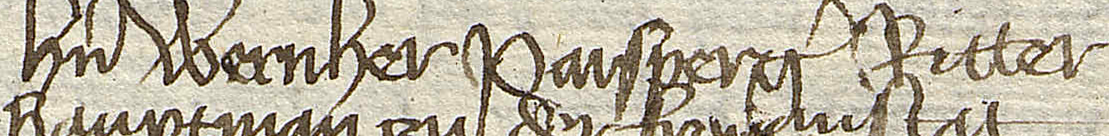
hn* Wernher Parſperg* Ritter
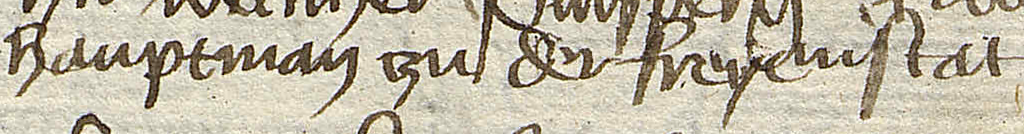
hauptman cʒu der freyenſtat
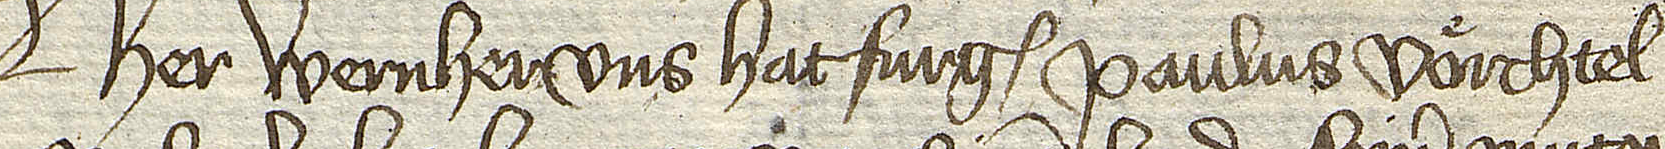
L* her Wernher vns hat furg* Paulus Vörchtel
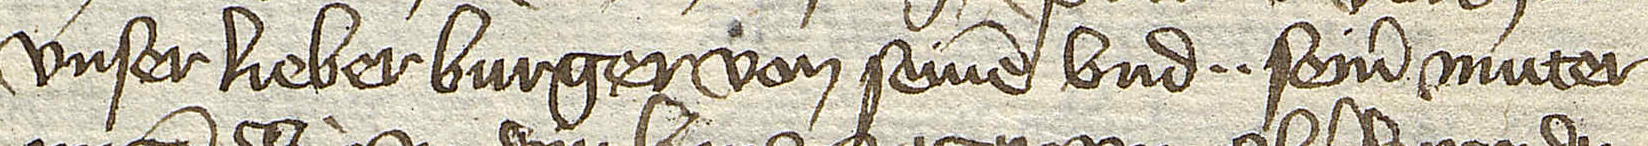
vnſer lieber burger von ſeine* vnd ~ ſein* muter
